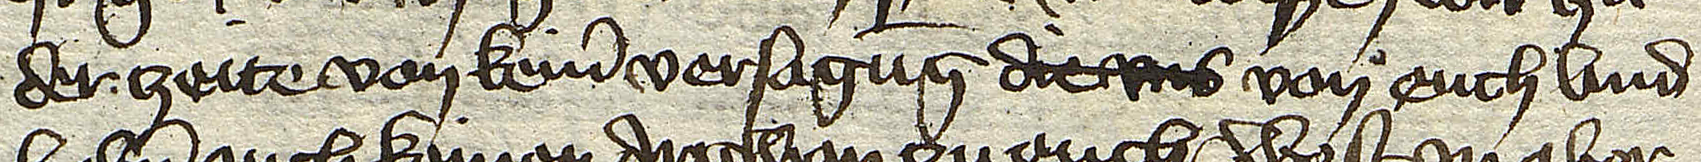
der cʒeite von kein* verſagug* die vns von euch vnd
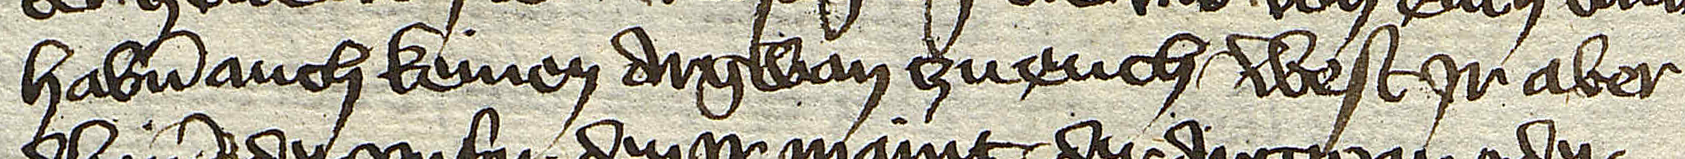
hab*n auch keinen Argwan cʒu euch / Weſt Ir aber
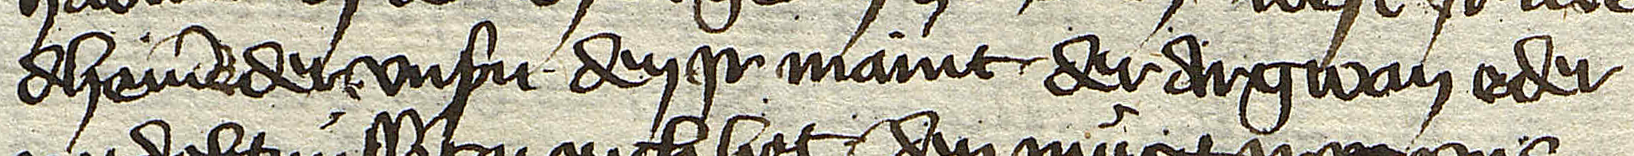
dhein* der vnſ*n . den Ir maint der Argwan oder
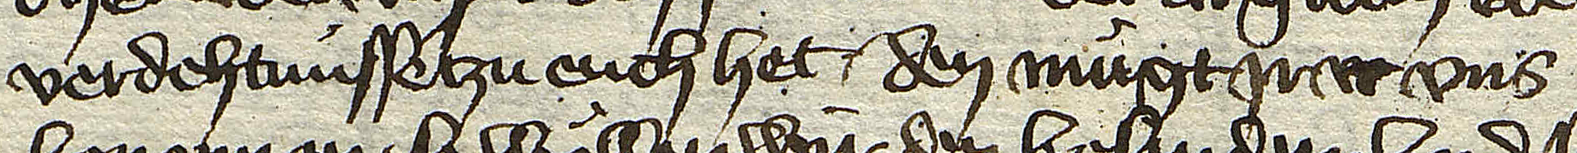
verdehtnüſſe cʒu euch het / den mügt Ir v vns
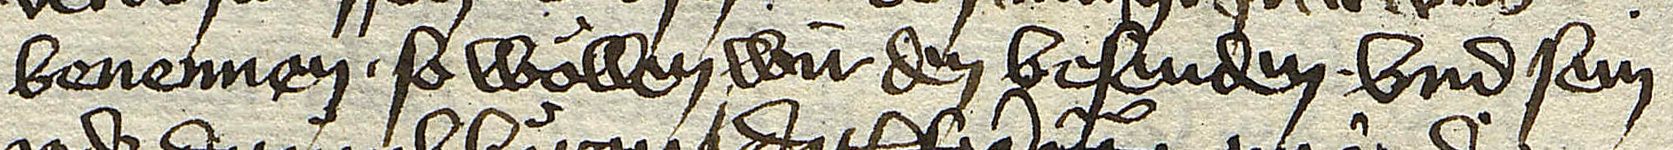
benennen . ſo wöllen wir den beſend* . Vnd ſein
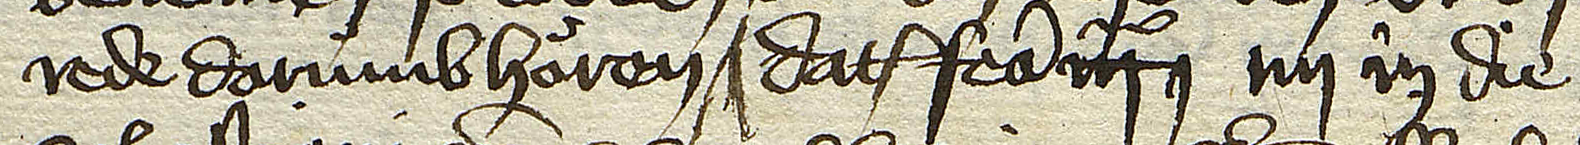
rede darümb hören / Dat* fe*a iii* i iiii in die
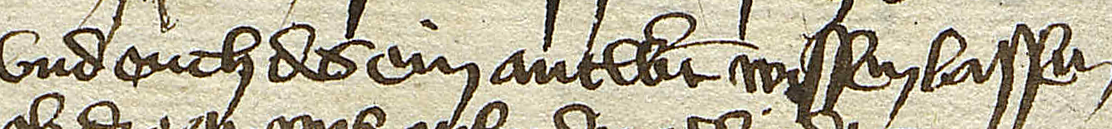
vnd euch des ein antw*t wiſſen laſſen
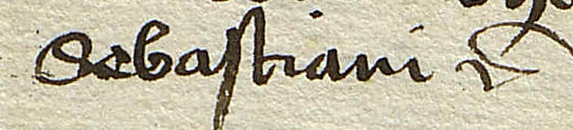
Sebaſtiani ec*
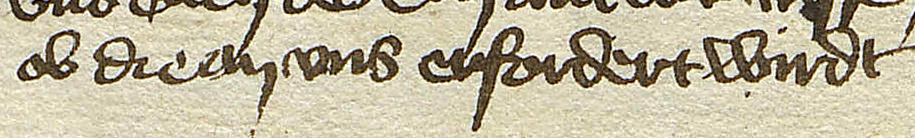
ob die an vns erfordert wirdt
